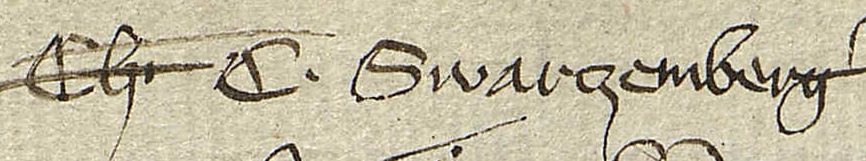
Ch C . Swarcʒemberg*
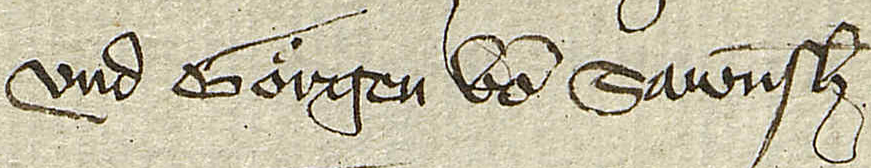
vnd Görgen vo* Sawnſh*
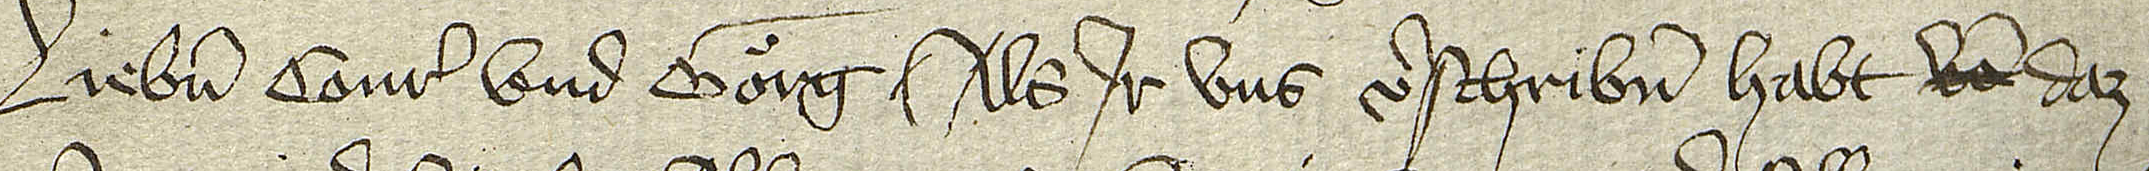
Liebn* Conr* vnd Görg / als Ir vns v*ſchribn* habt vo* daʒ
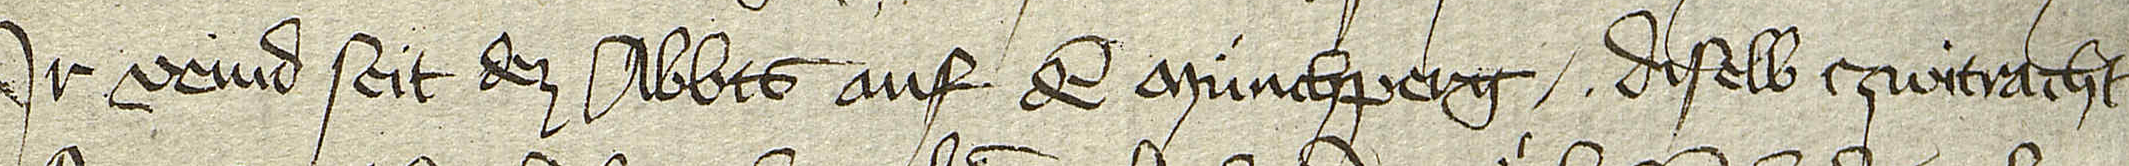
Ir veind ſeit deʒ Abbts auf d* Münchperg / . diſelb cʒwitracht
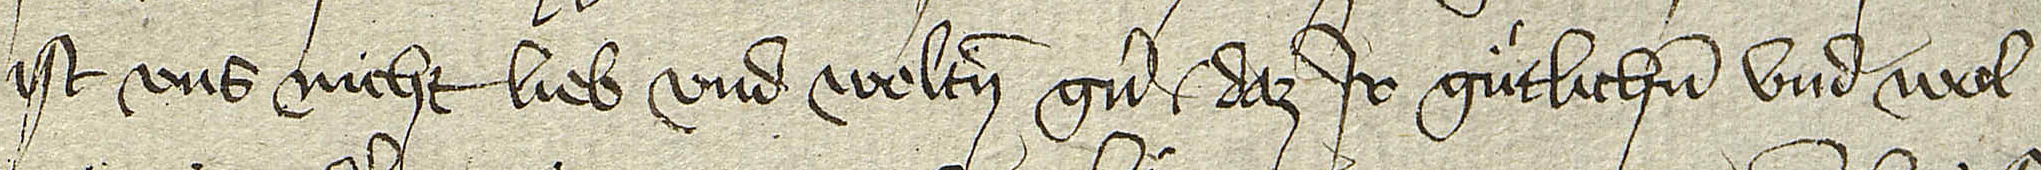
iſt vns nicht lieb vnd woltn* gn* / daʒ Ir gütlichn* vnd wol
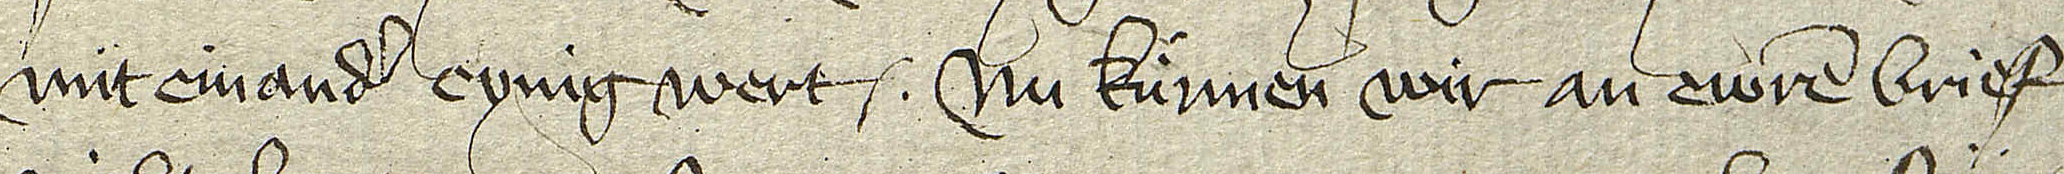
mit einand* eynig wert / . Nu künnen wir an ewre* brief
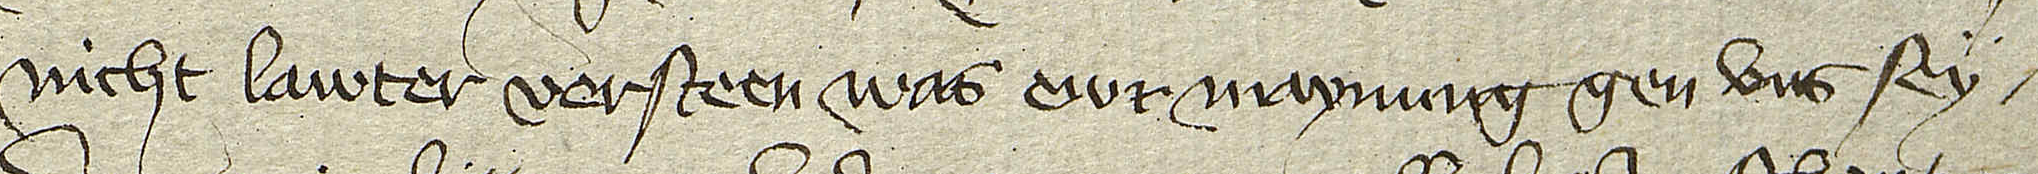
nicht lawter verſteen was ewr maynung gen vns ſey /
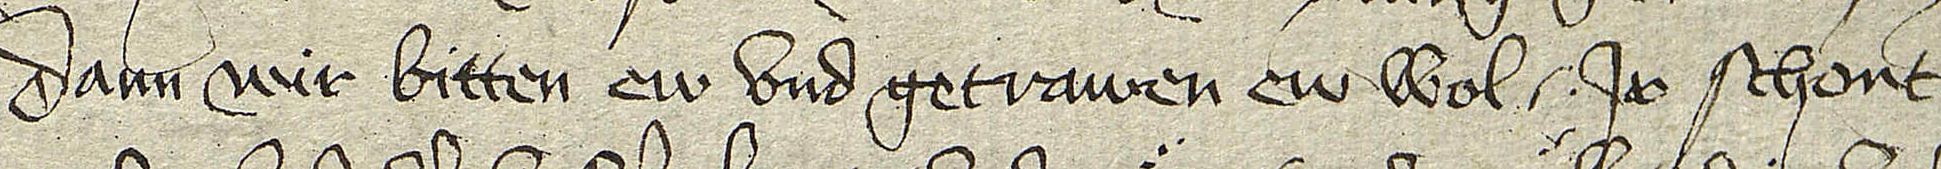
Dann wir bitten ew vnd getrawen ew wol / . Ir ſchont
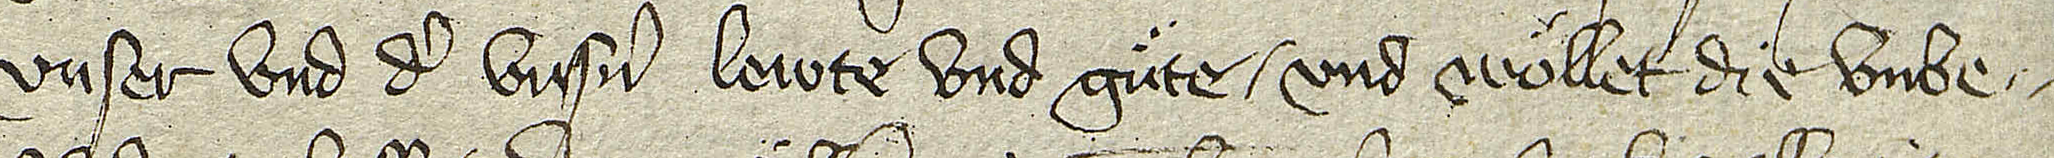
vnſer vnd d* vnſn* lewte vnd güte / vnd wöllet die vnbe =
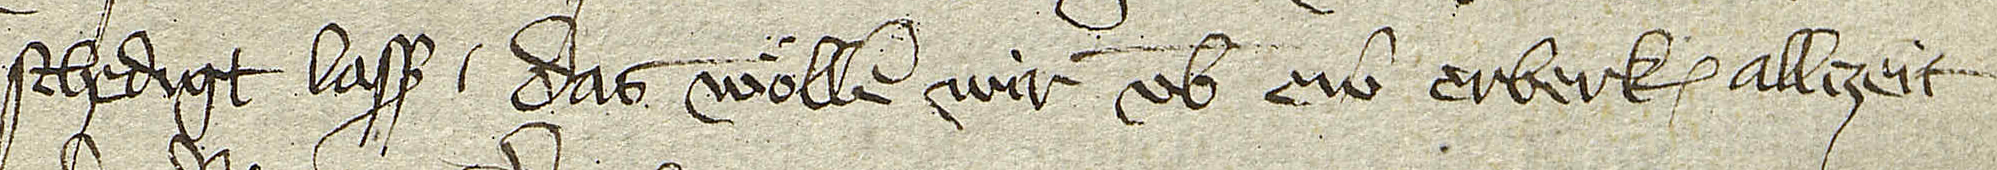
ſchedigt laſſ* / Das wölle* wir vb* ew* erberk* allcʒeit
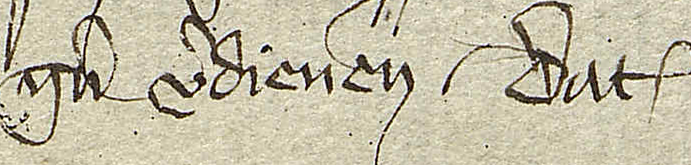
gn* v*dienen / Dat*
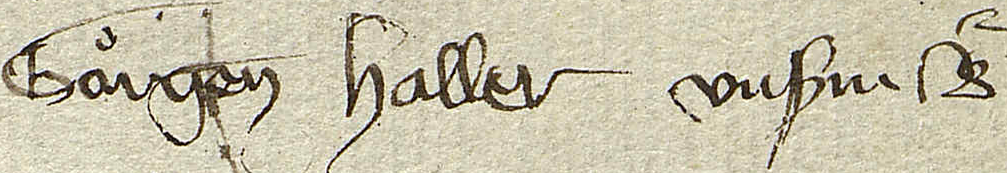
Görgen Haller vnſm* B*
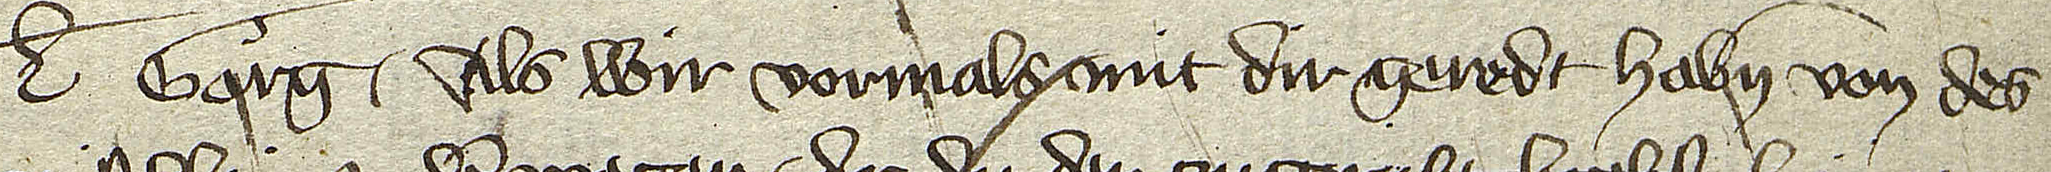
L* Görg / Als wir vormals mit dir geredt habn* von des
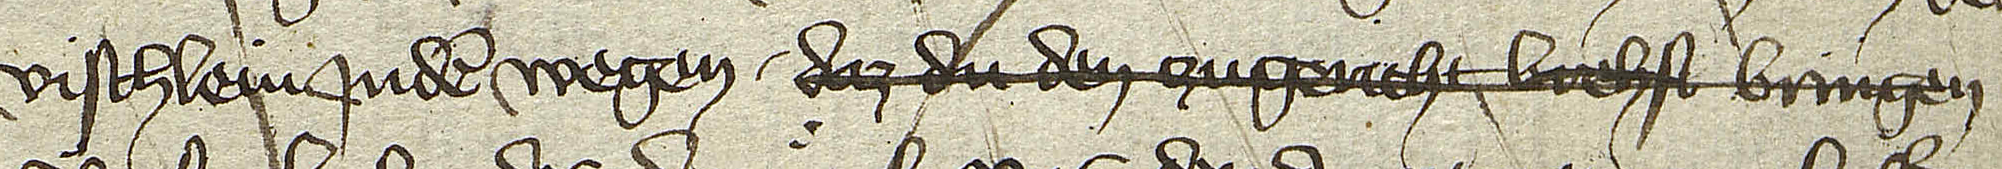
viſchlein Iude* wegen / daʒ du den cʒu gericht brehſt bringen
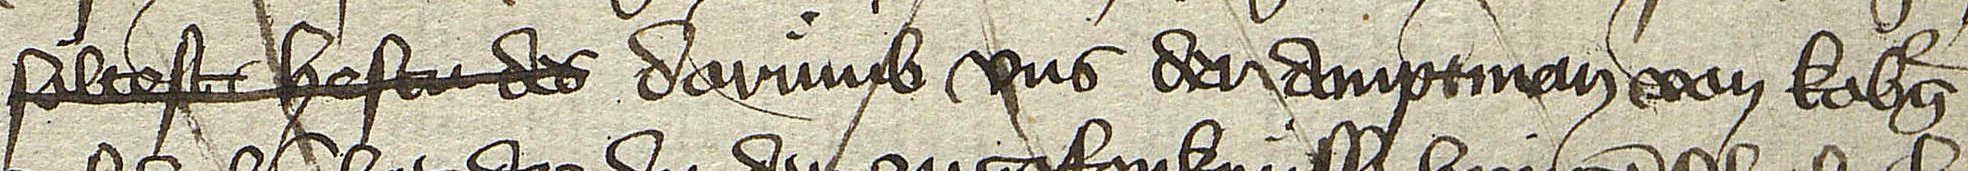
ſölteſt / heſtu des darümb vns der Amptman von kob*g
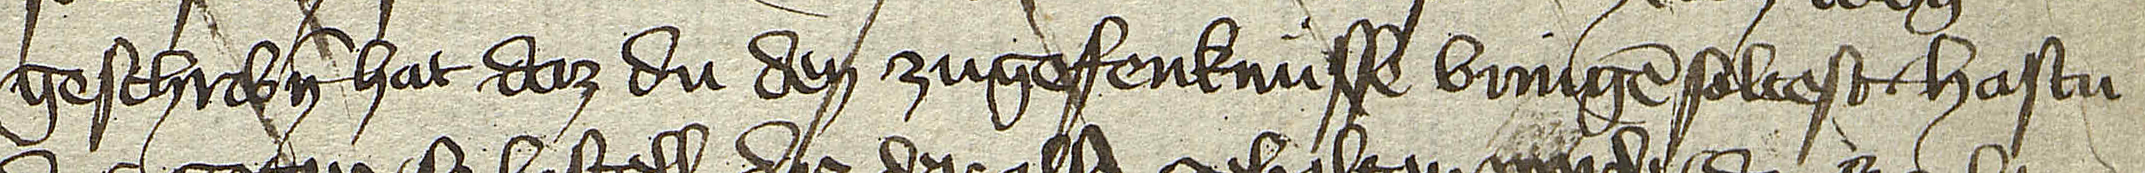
geſchribn* hat / daʒ du den ʒugefenknüſſe bringe* ſolteſt / Haſtu
